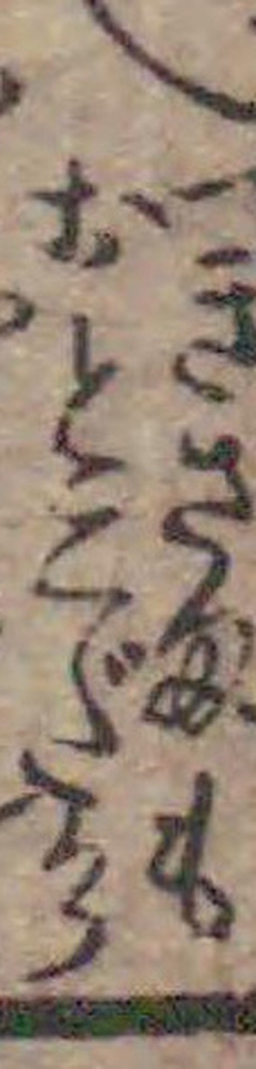おとこだろ
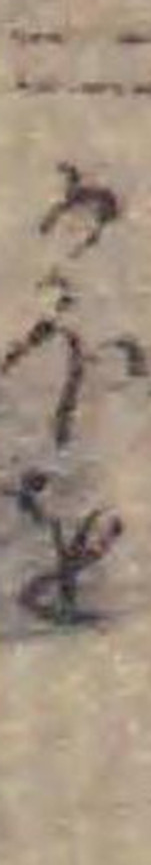かほを
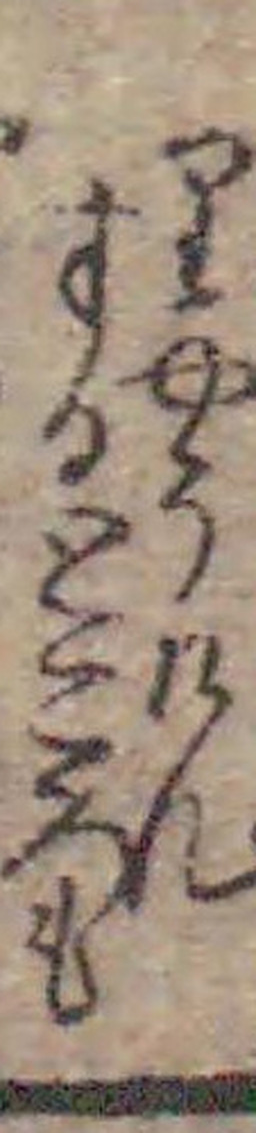するところも
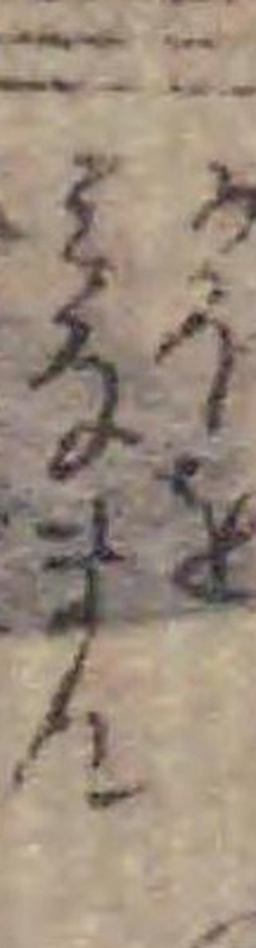みなまん
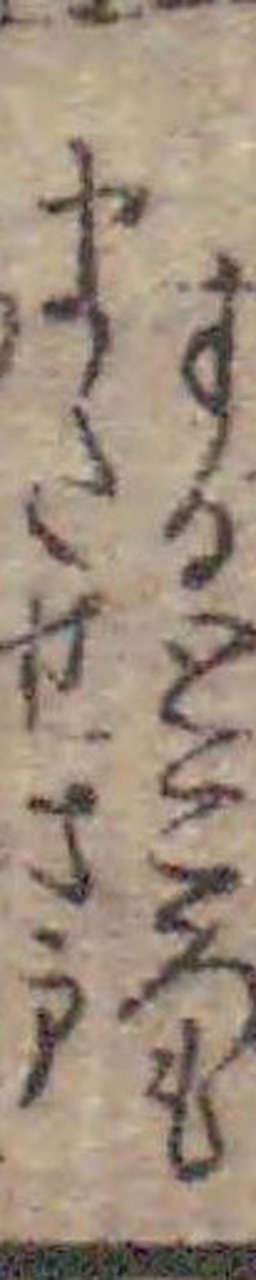またせさァ
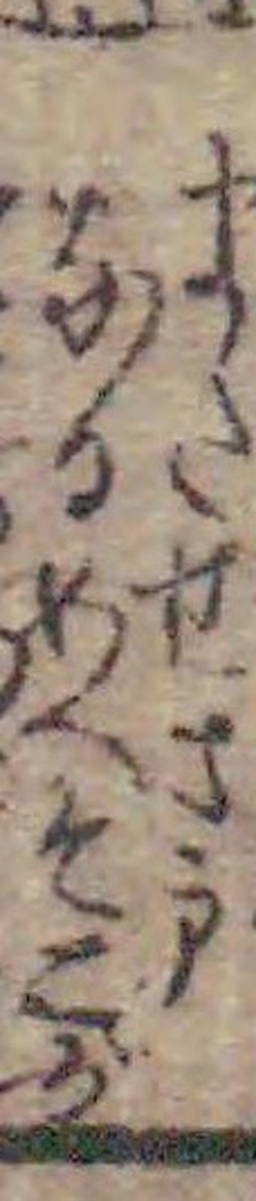なるめへそこが
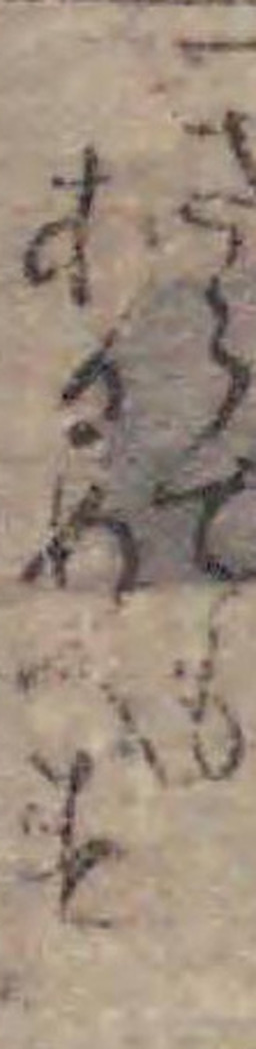あるめへす
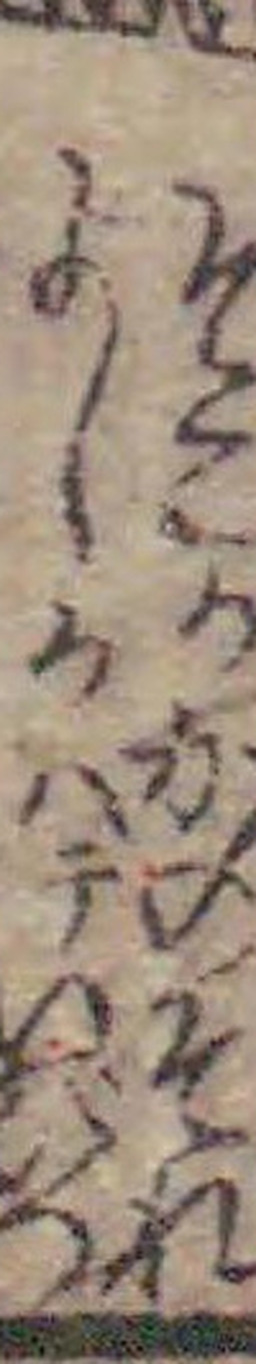よしかハテいびつ
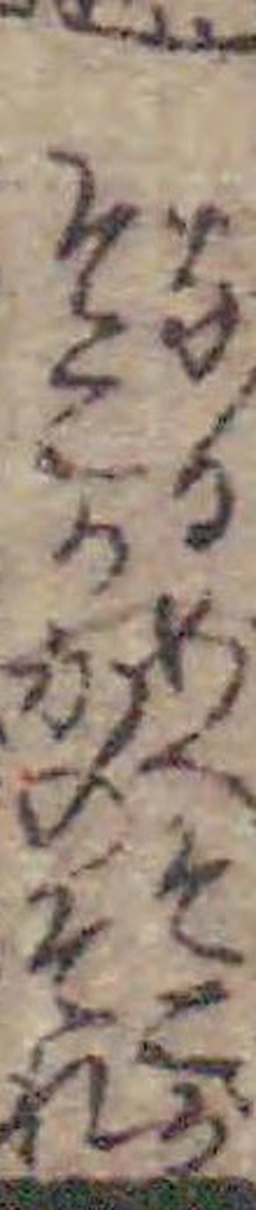そこかのそれ
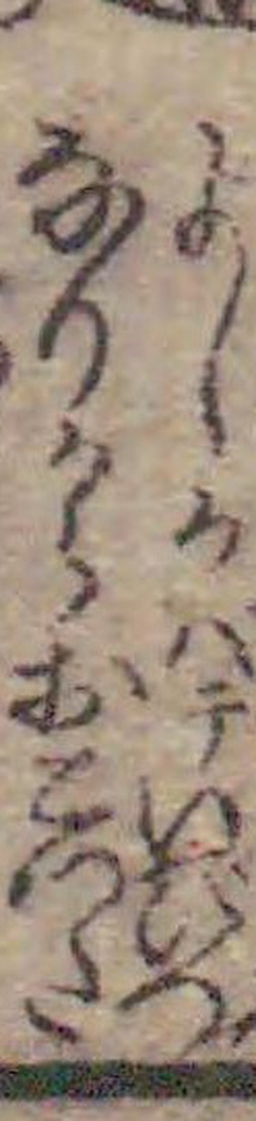なりからおこつた
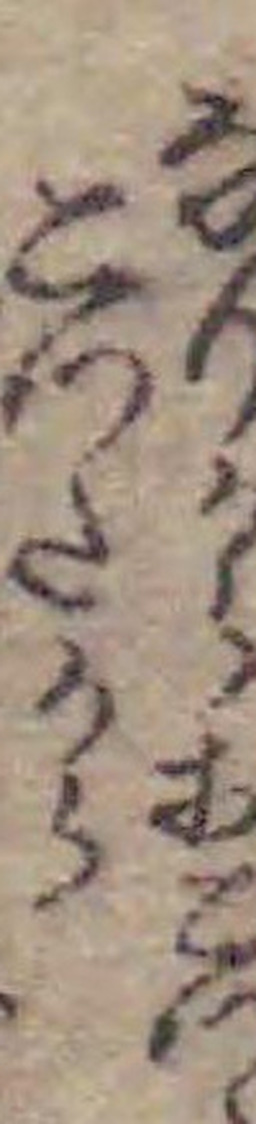こつたから
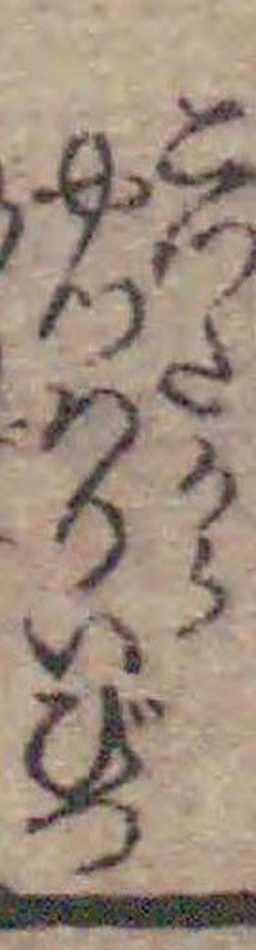やつはりいびつ
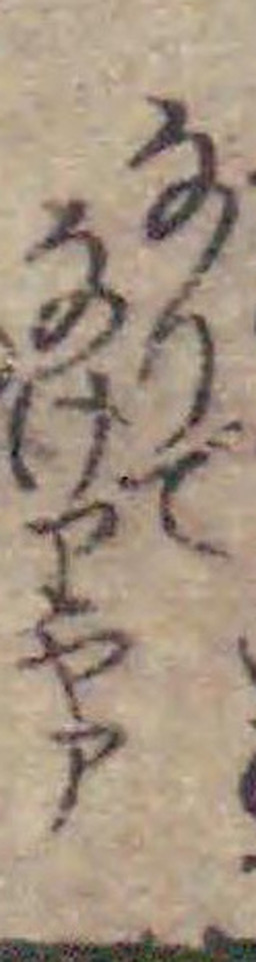なけりやァ
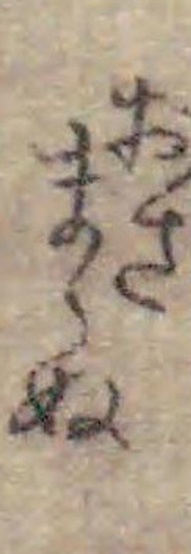まらぬ
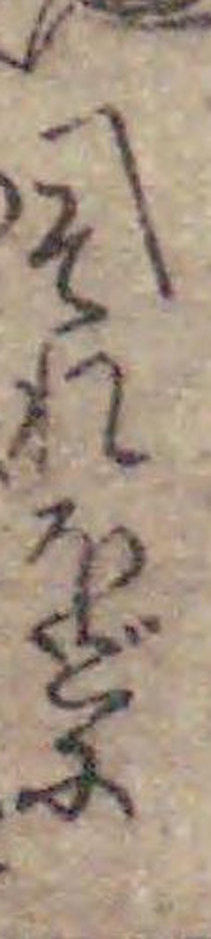〽それほどに
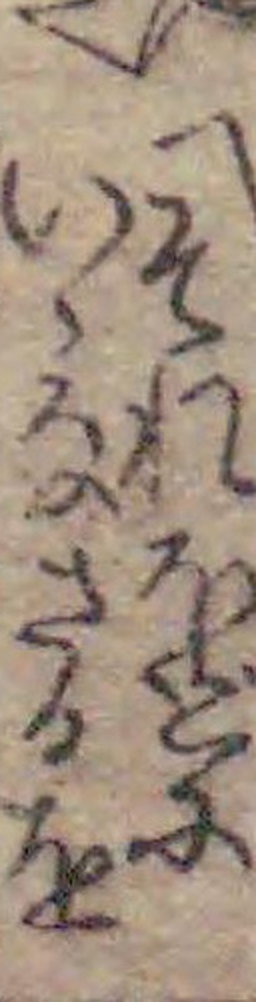いゝなさるを
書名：新鋳小判 : 3巻
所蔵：国立国会図書館 National Diet Library, JAPAN
